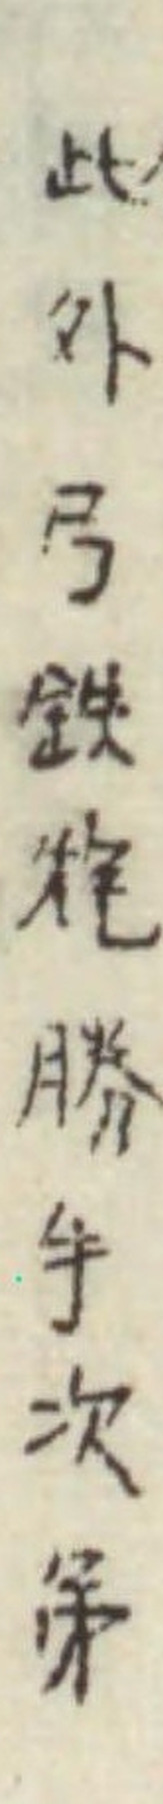此外弓鉄炮勝手次第
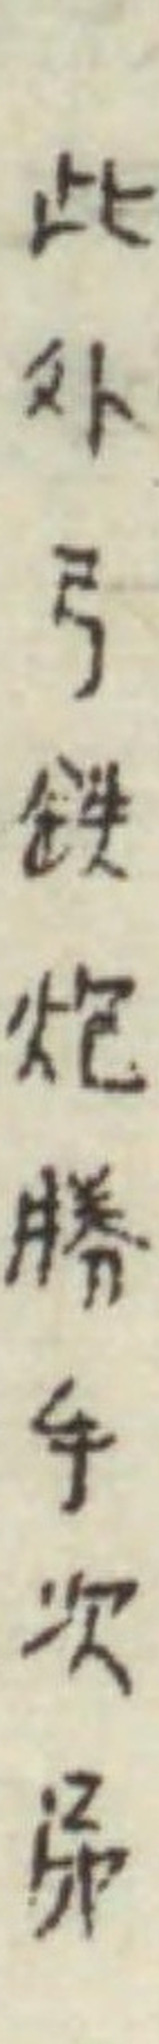此外弓鉄炮勝手次第
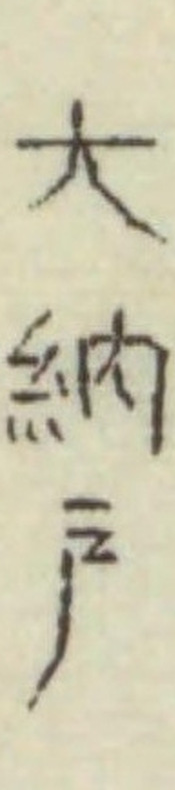大納戸
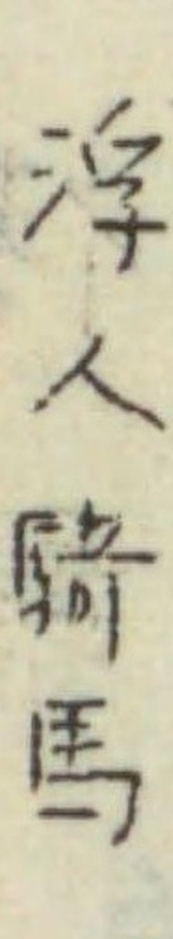浮人騎馬
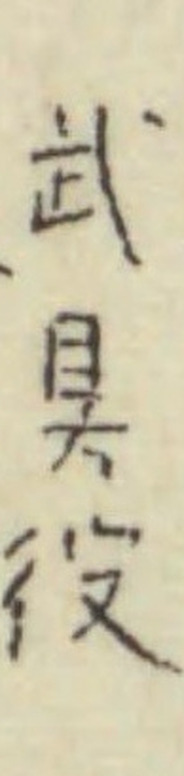武具役

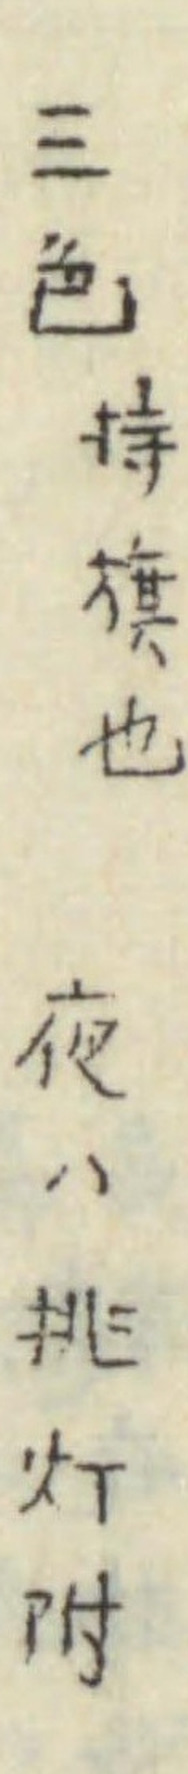旗三色特旗也夜ハ挑灯附
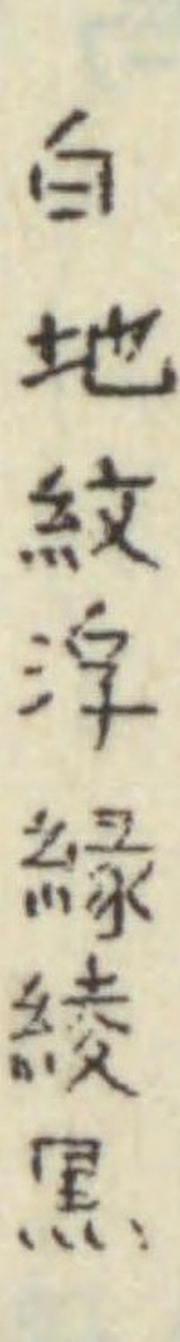白地紋浮緑綾黒
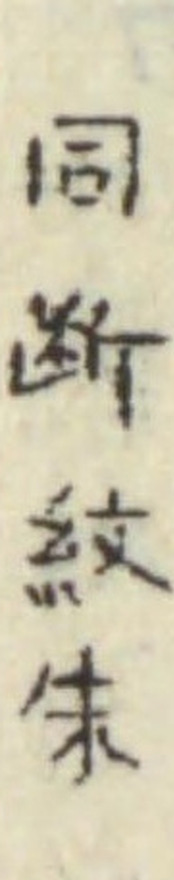同断紋朱
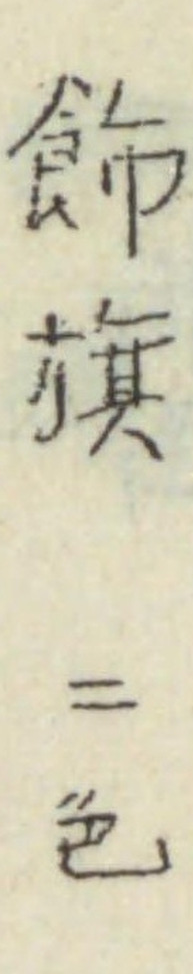飾旗二色
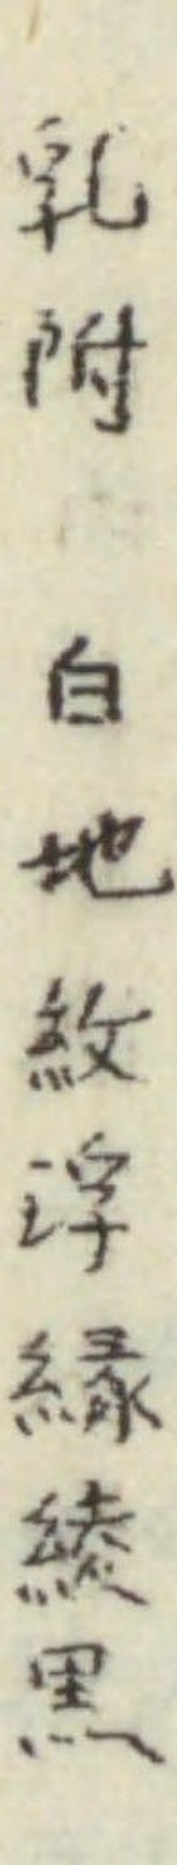乳附白地紋浮緑綾黒
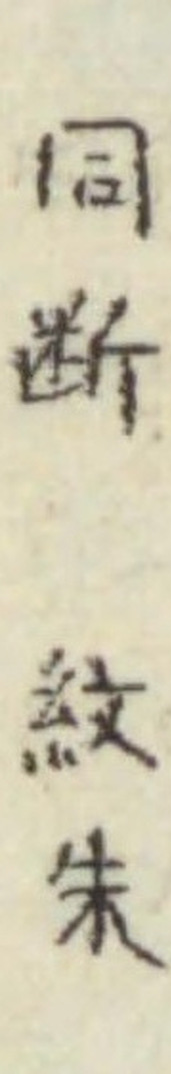同断紋朱
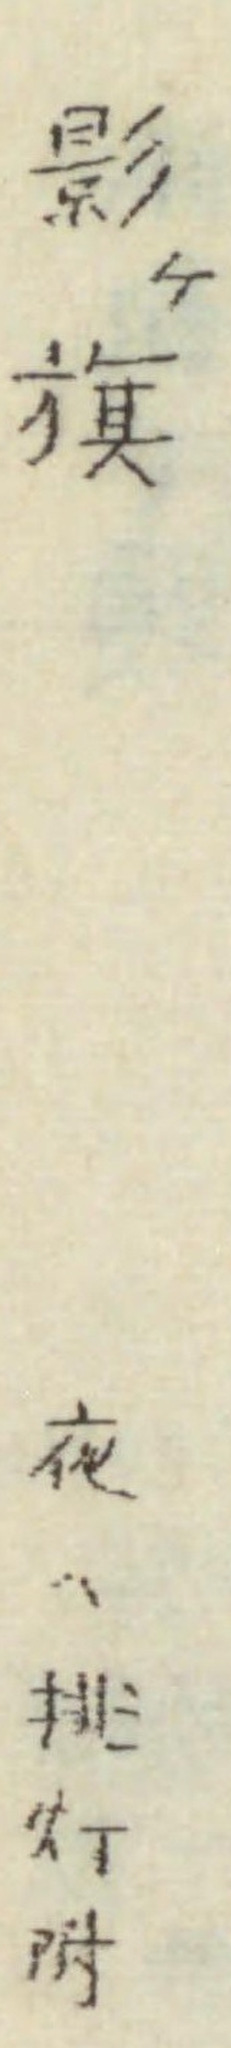影ヶ旗夜ハ挑灯附
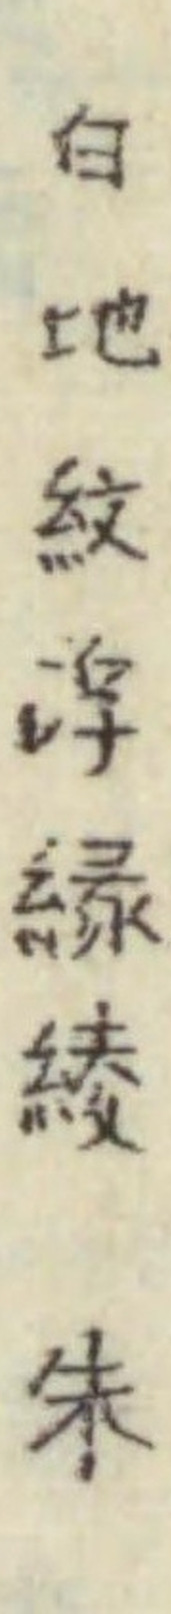白地紋浮緑綾朱
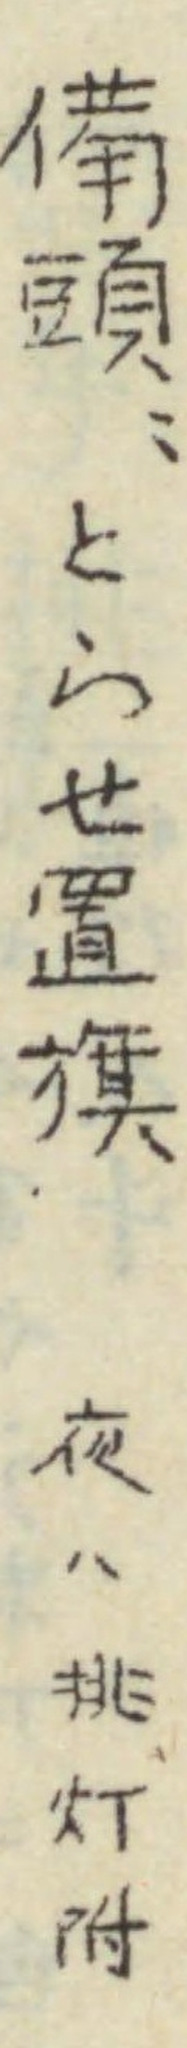備頭二とらせ置旗夜はハ挑灯附
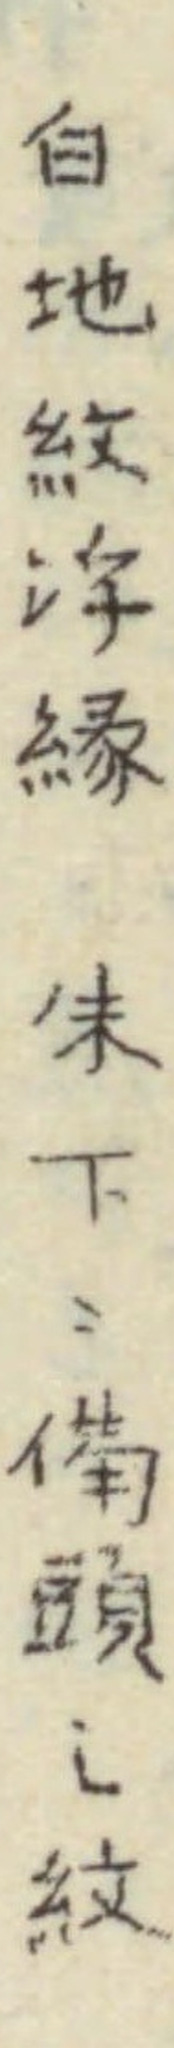白地紋浮緑朱下二備頭之紋
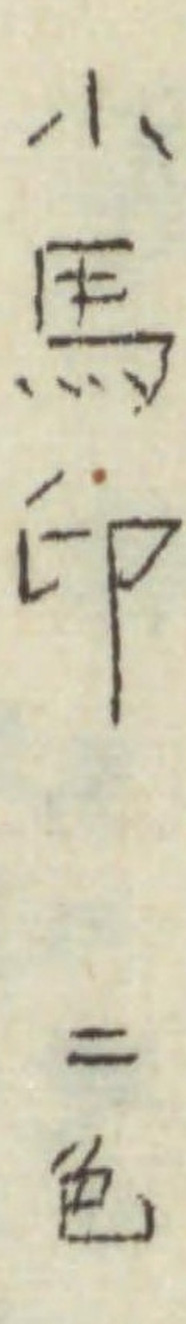小馬印二色
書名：三河吉田藩動員史料
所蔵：国立国会図書館 National Diet Library, JAPAN
